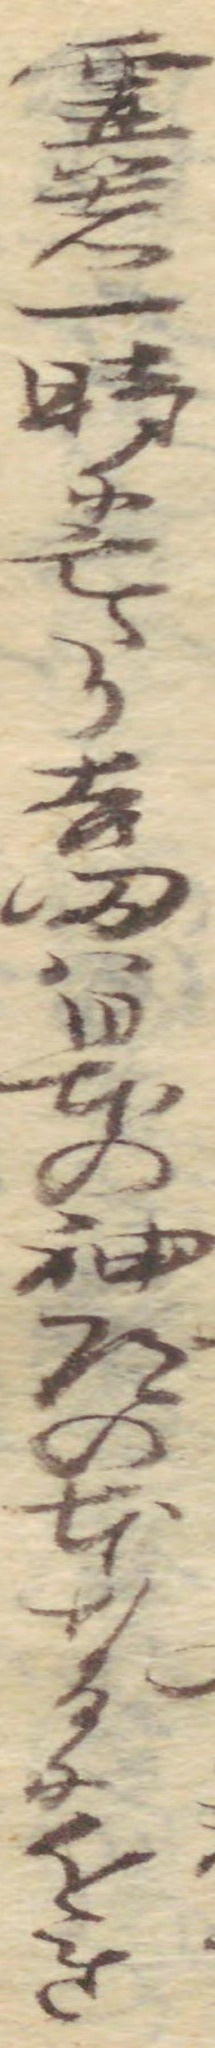霊器一時に亡たり吉田は日本の神道の本なるに近き
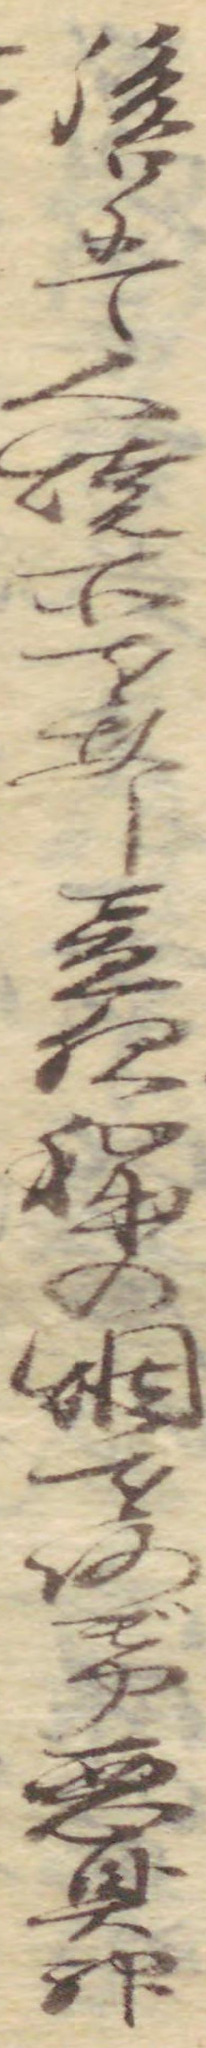後には人焼所をなし昼夜穢の烟をあげ悪臭神
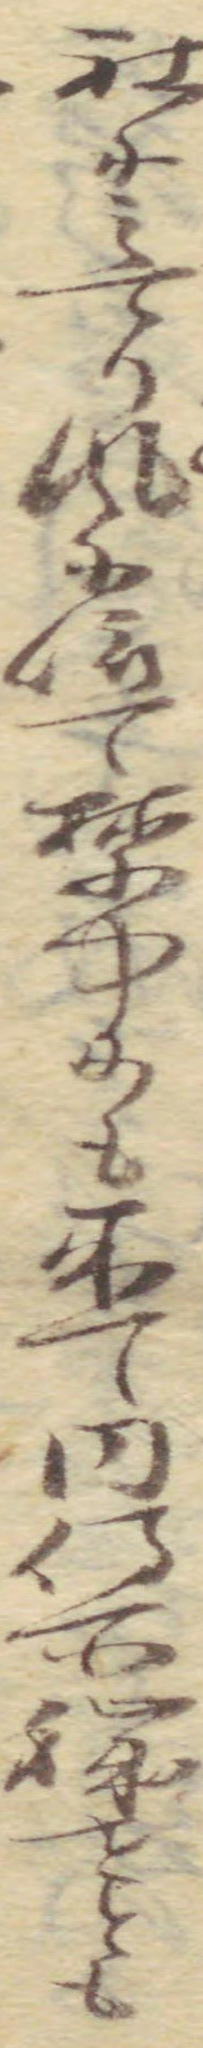社にみてり風に依て禁中にも来て内侍所穢せとも
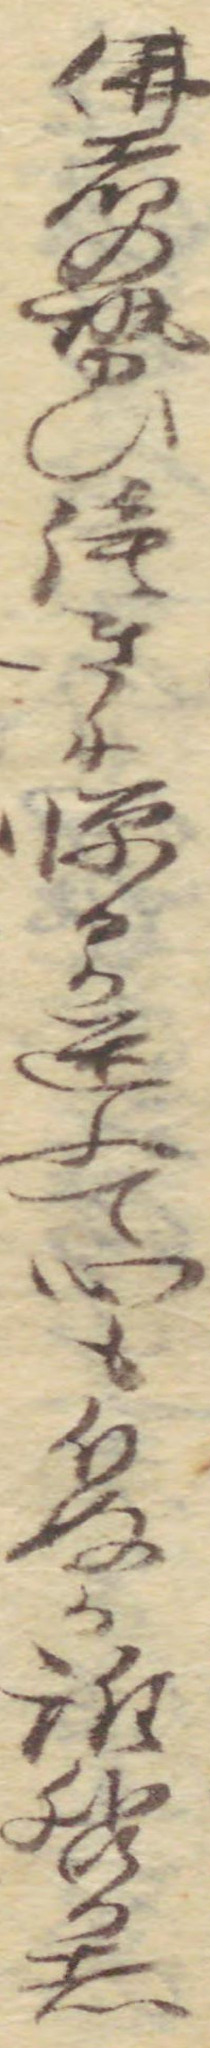仏者の勢ひ強きに憚るか迷ふて心も付ぬか誰咎る者
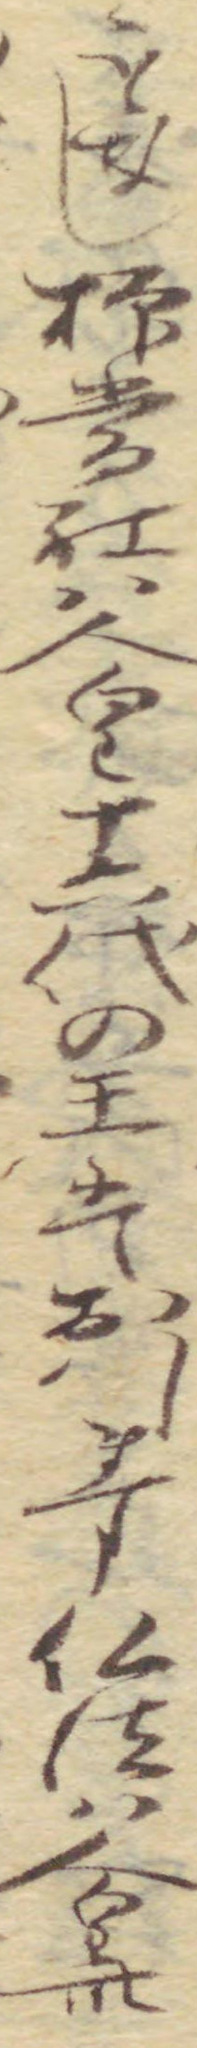もなし抑当社は人皇十六代の王にておはします仏法は人皇卅
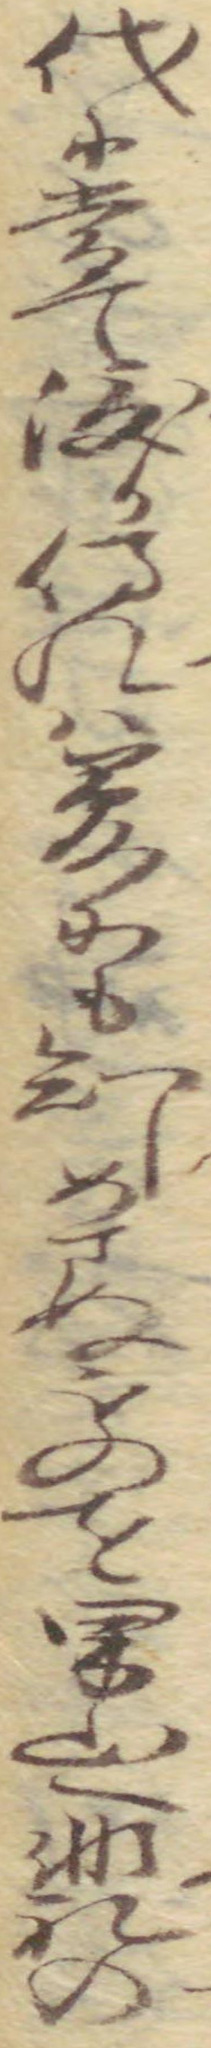代に当て渡り侍れは夢にも知しめさぬものを男山へ非礼の
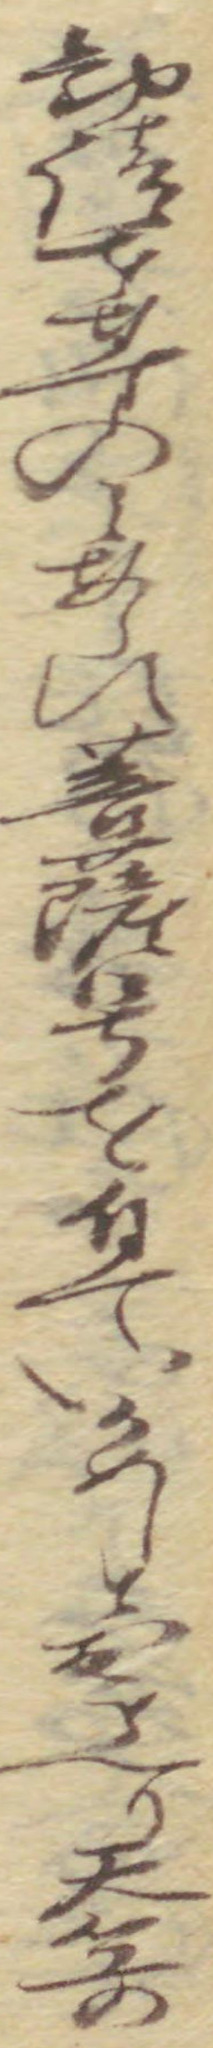勧請をなすのみならす菩薩号を付ていかめしとおもへり天竺の
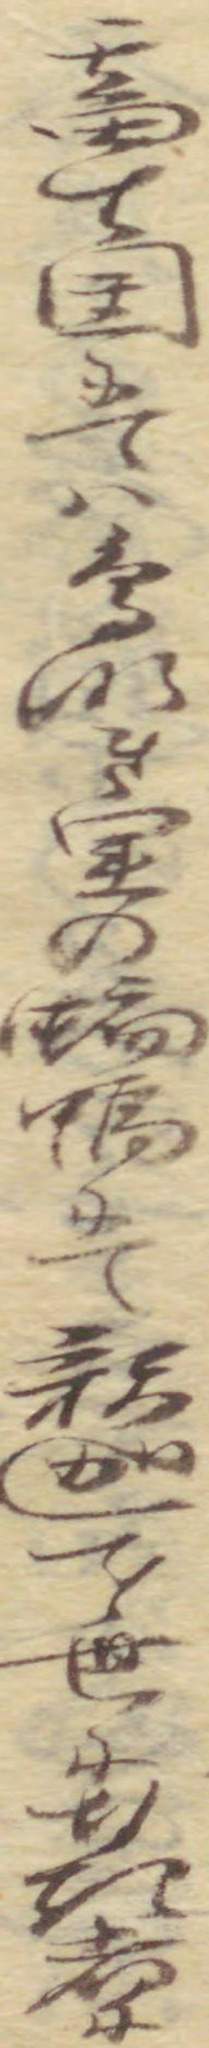畜生国にては鳥なき里の蝙蝠にて釈迦を世になき者に
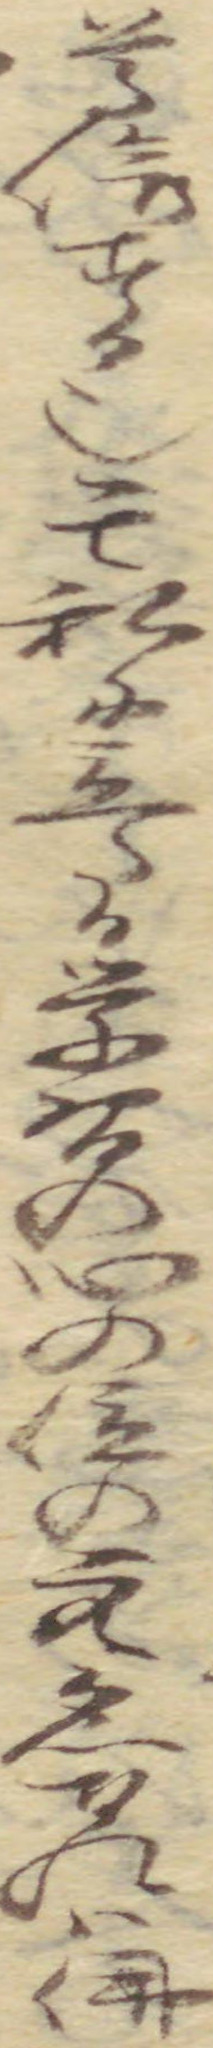尊信する也其私に立たる学習の心の位の空名なれは仏
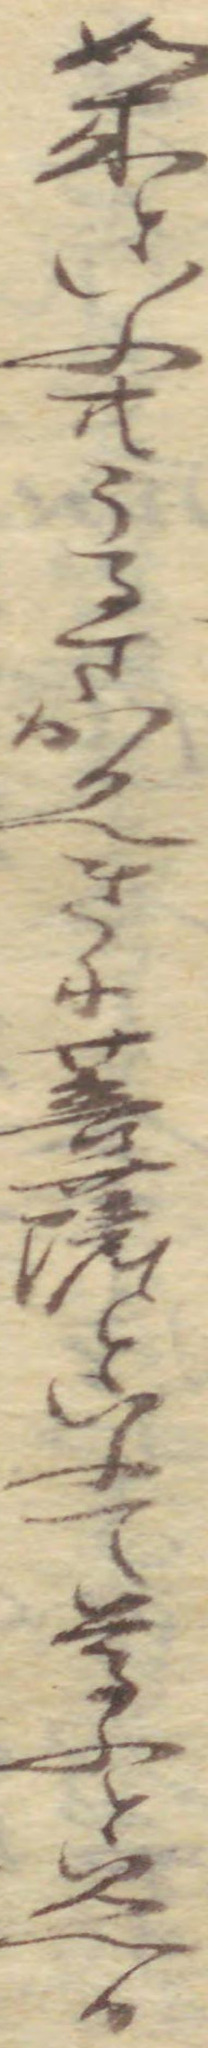如来といふ共うるさかるへきに菩薩といふて尊ふと思へる
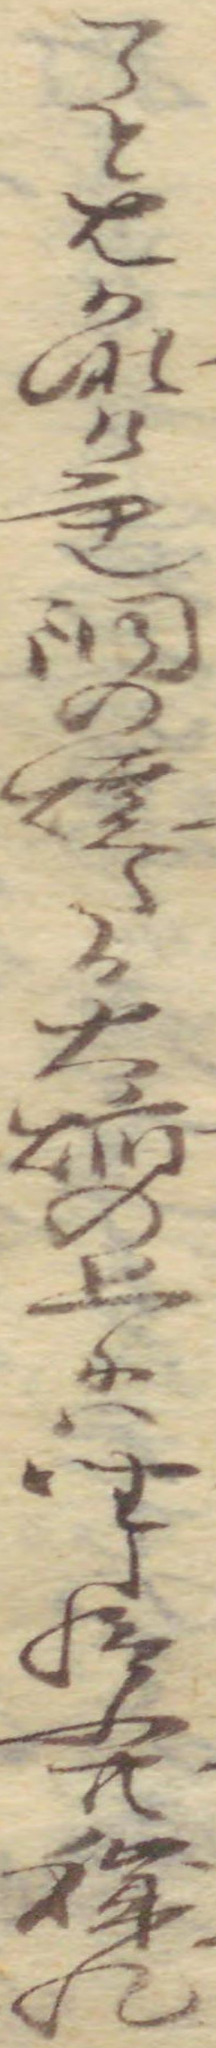こそはかなけれ銅の焼たる火焔の上には坐し給ふ共穢れ
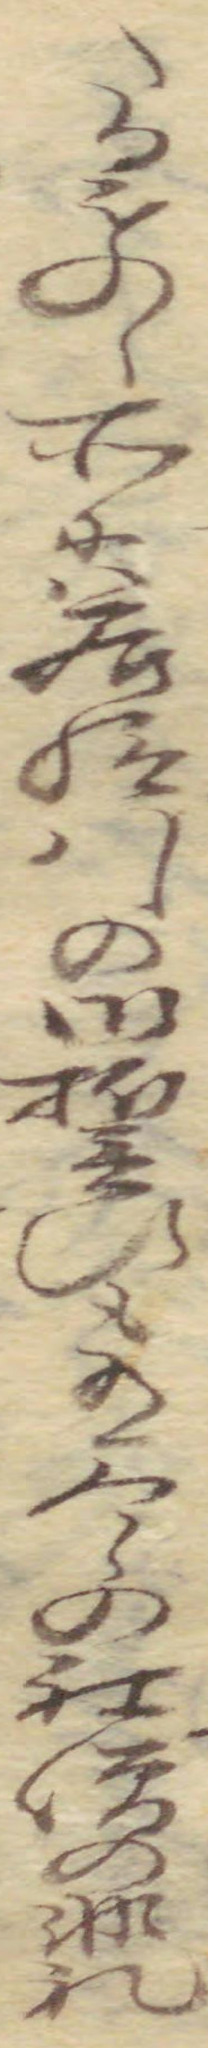たるものゝ所には居給はしの御誓ひも有今の社僧の非礼
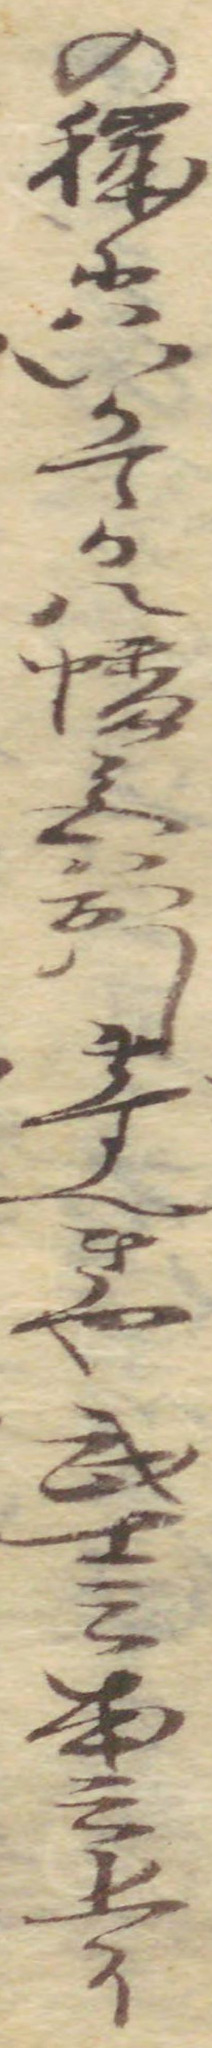の穢にはいかてか八幡宮はおはしますへきや武士云或云上に
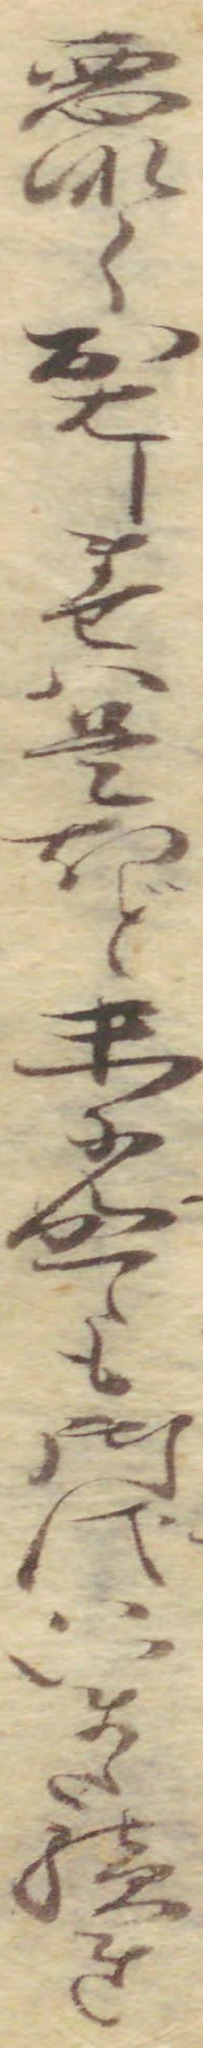悪なくおはしませは是ほど末に成ても御代はいまた続き
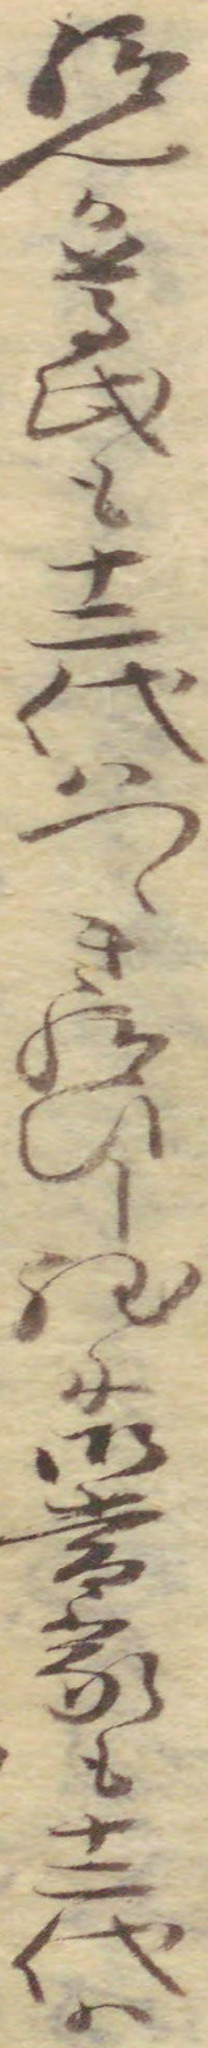給んか尊氏も十二代はつゝき給ひし程に御当家も十二代は
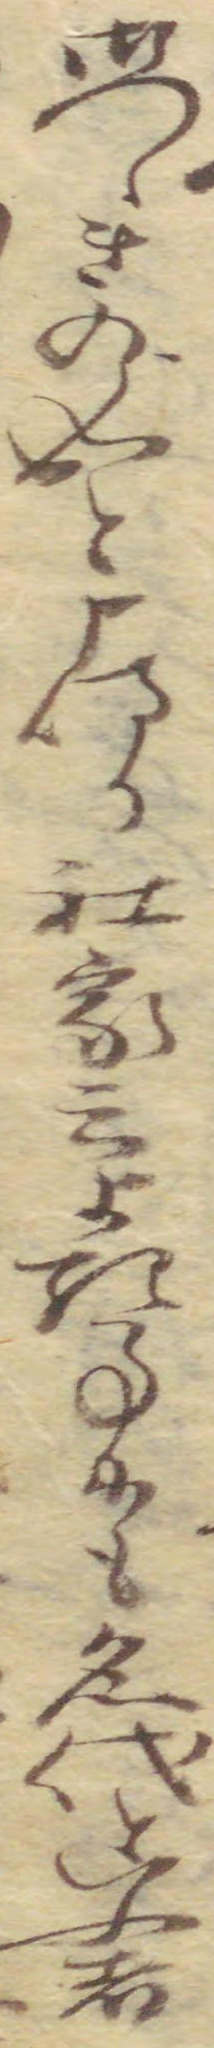御つゝき可被成と申侍り社家云よき事にも名代といふ者
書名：鶯宿雑記. 巻263-264
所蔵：国立国会図書館 National Diet Library, JAPAN
